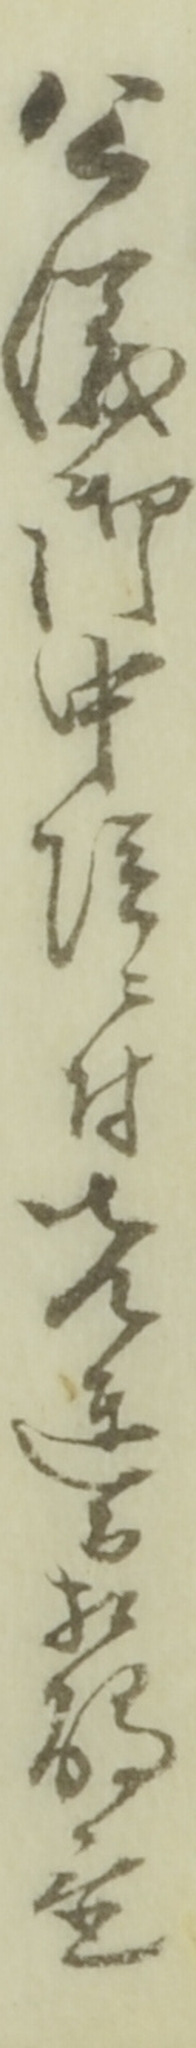公儀御中陰二付先達而相触置
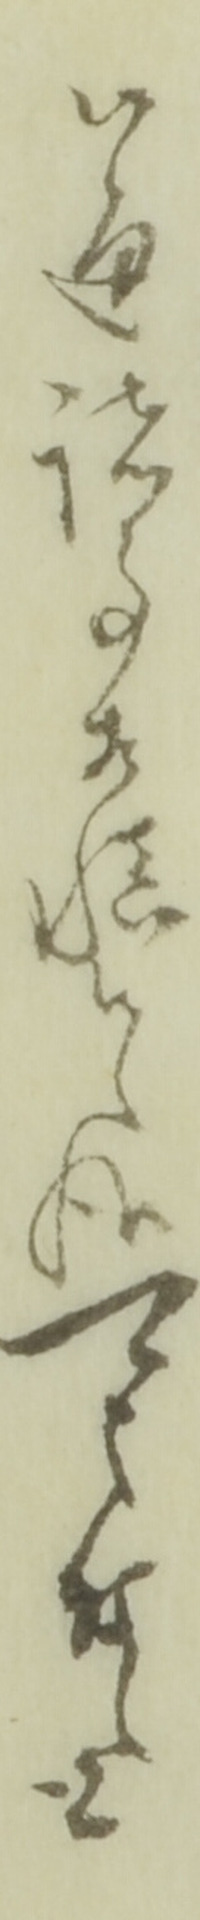候通諸事相慎候様可申付候以上
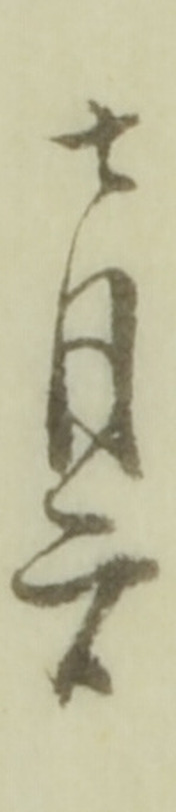七月二日
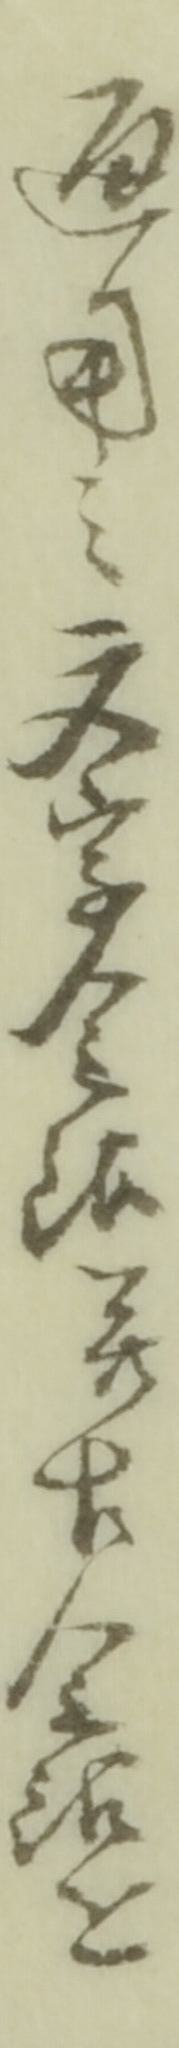通用之文字金銀並生金銀を
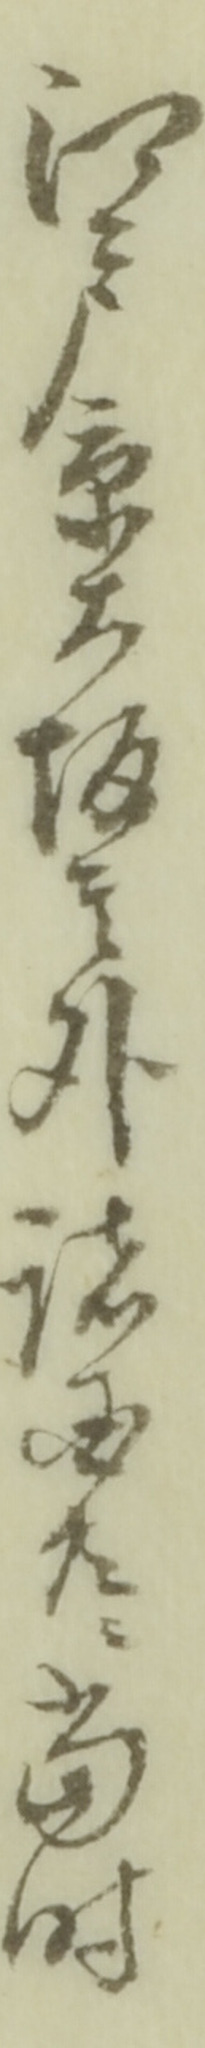江戸京大坂之外諸国共二当時
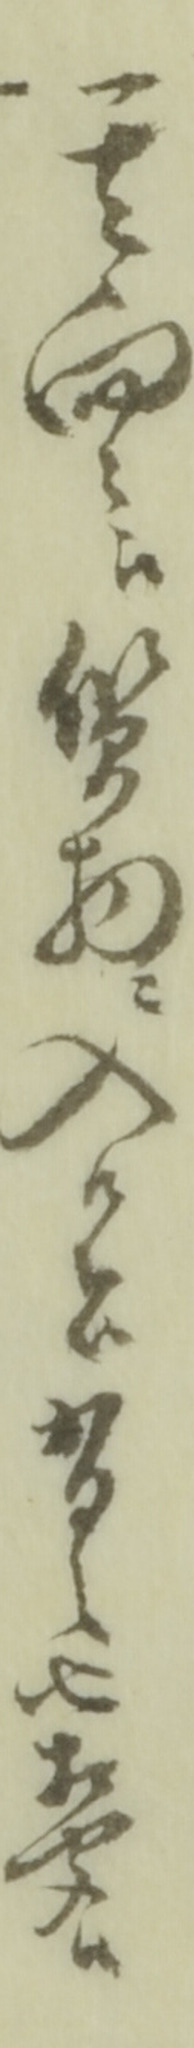其向々え貨物二入候者有之由相聞候
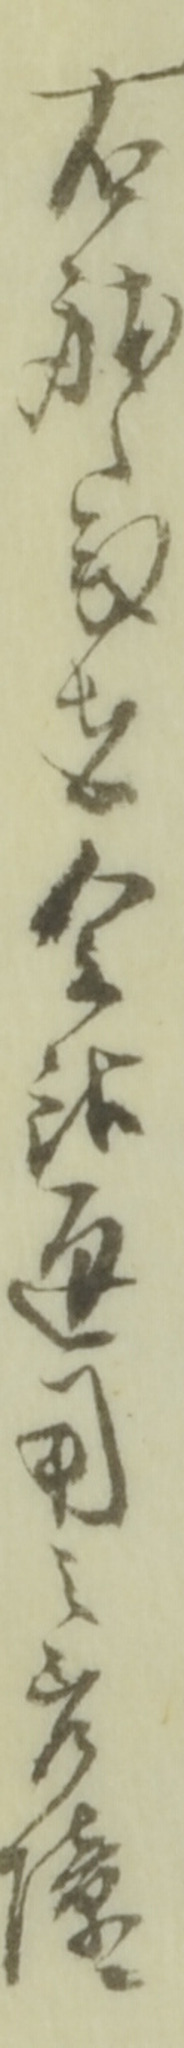右躰之義者金銀通用之差障二
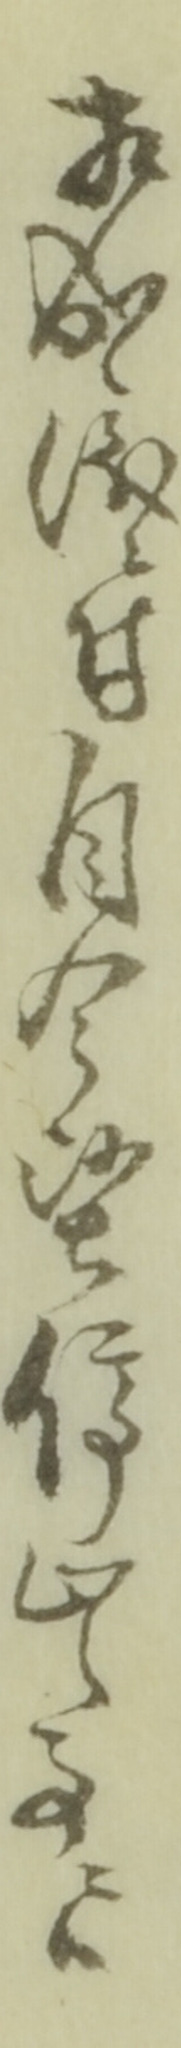相成候儀二付自今堅停止之事二候
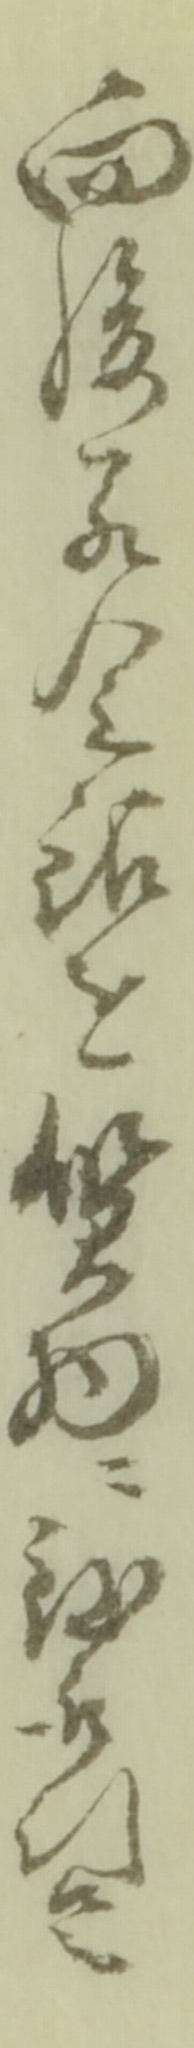向後若金銀を貨物二致取引候之
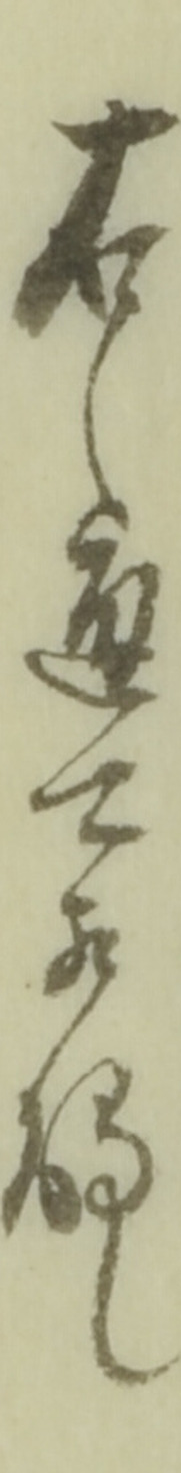右之通可相触候
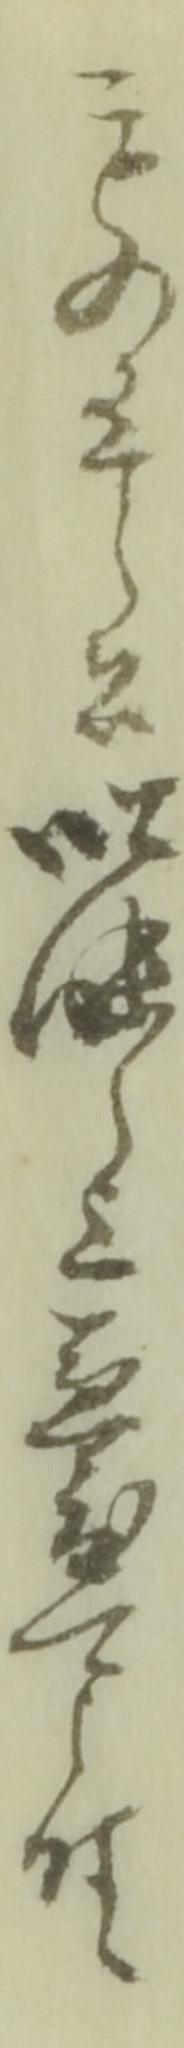もの有之者吟味之上急度可申付候
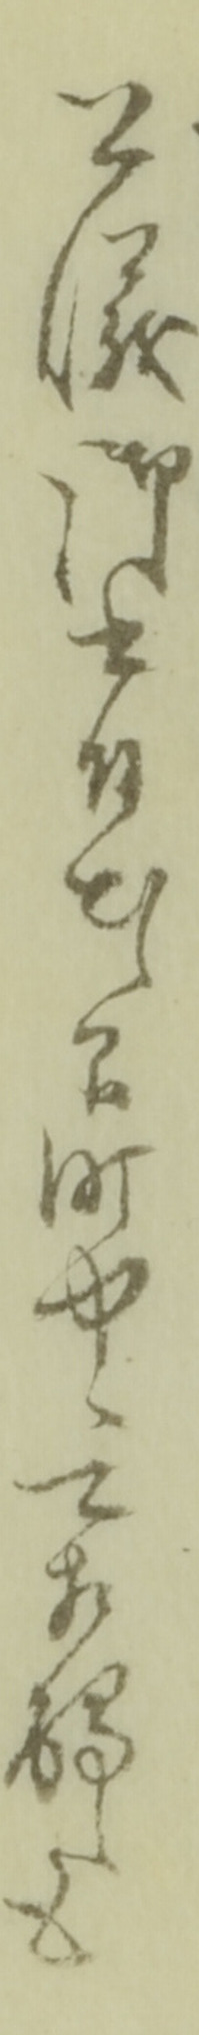公儀御書付出候間町中へ可相触候以上
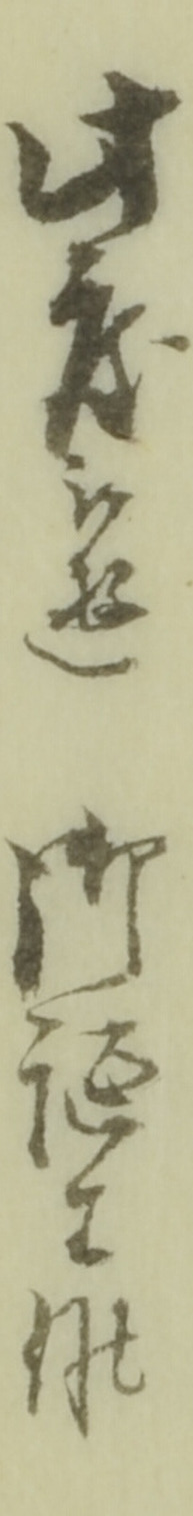此度被遊御誕生候
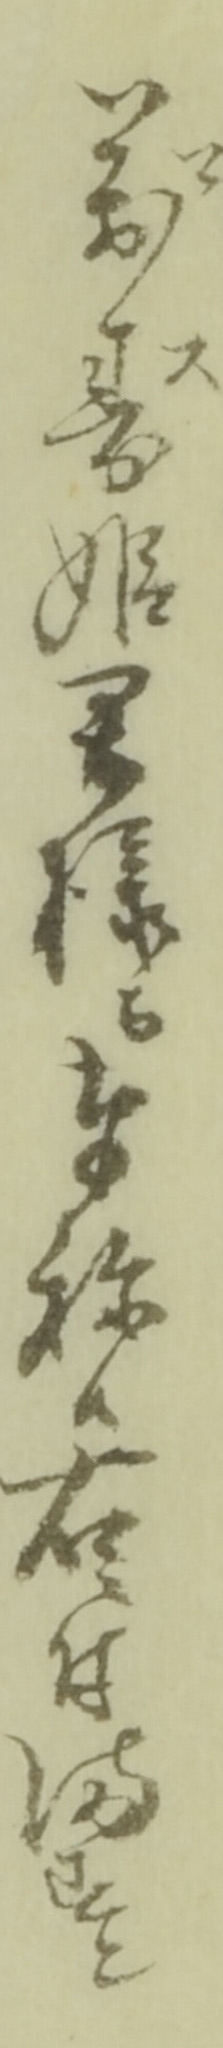萬寿姫君様と奉称候右二付満寿と
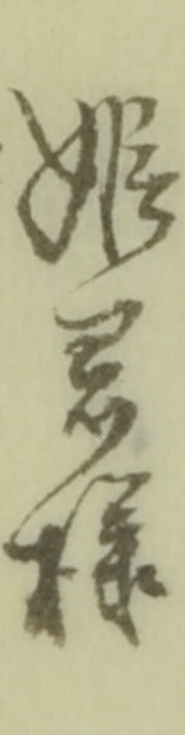姫君様
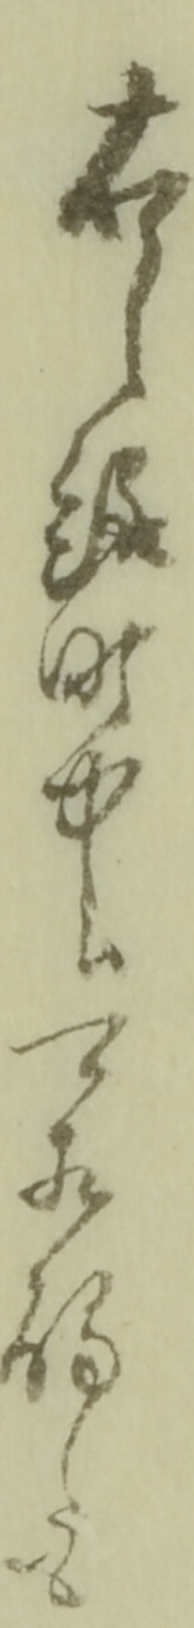右之趣町中え可相触候以上
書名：御公儀様御領主様御触書控
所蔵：伊那市立高遠町図書館・合同会社AMANE
